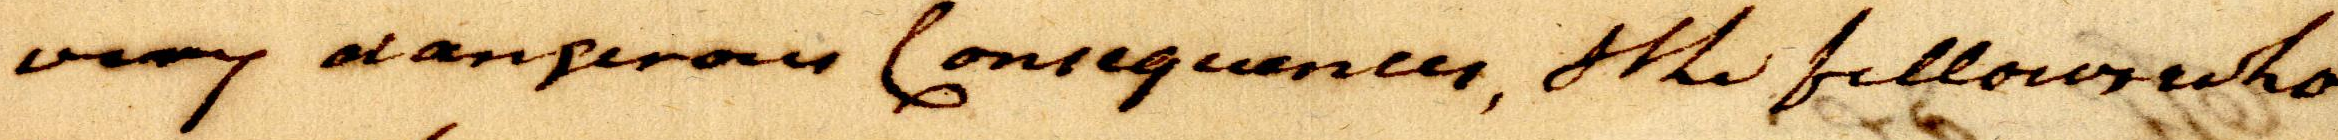very dangerous Consequences, & the fellows who
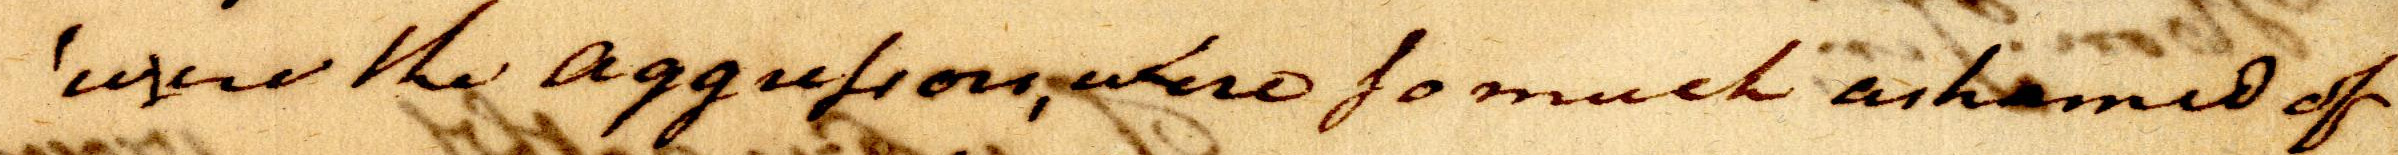were the aggressors, were so much ashamed of
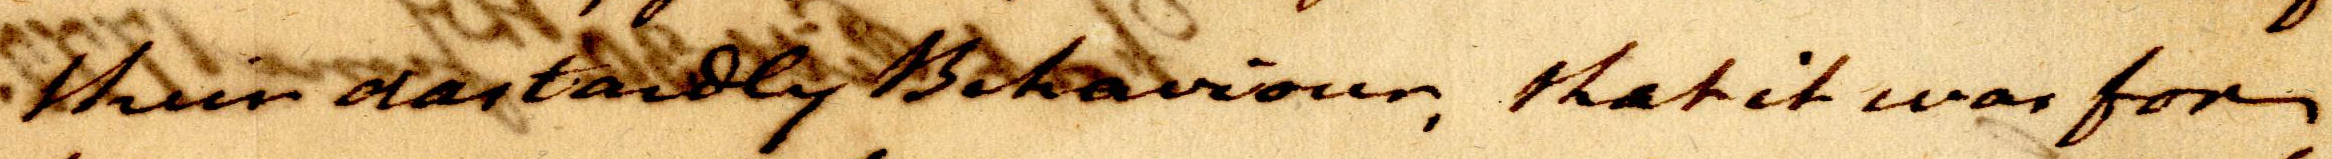their dastardly Behaviour, that it was for
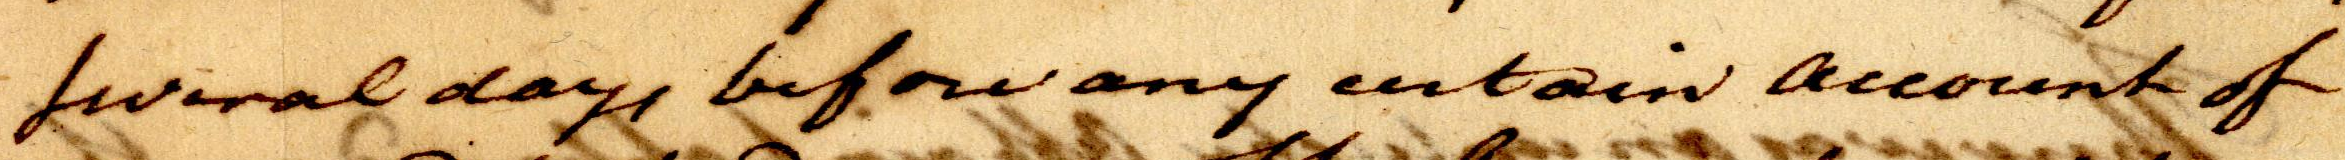several days before any certain account of
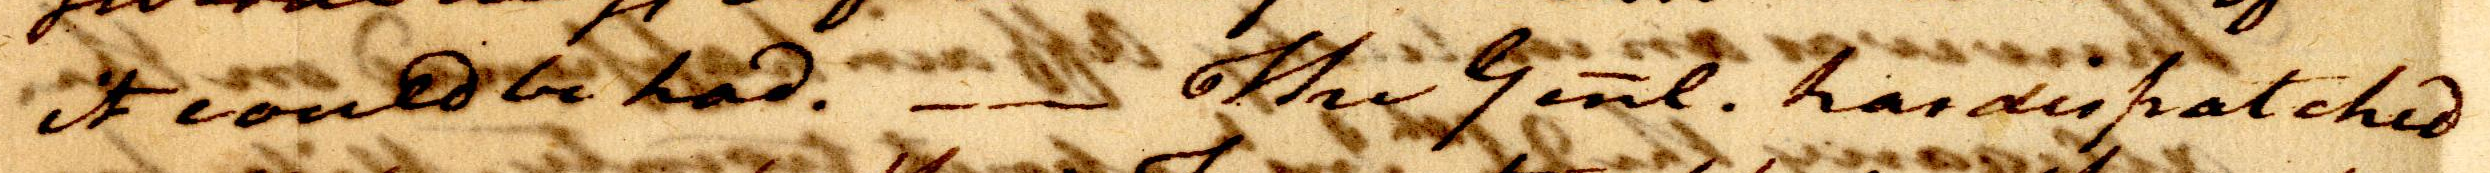it could be had.- The Gen̄l. has dispatched
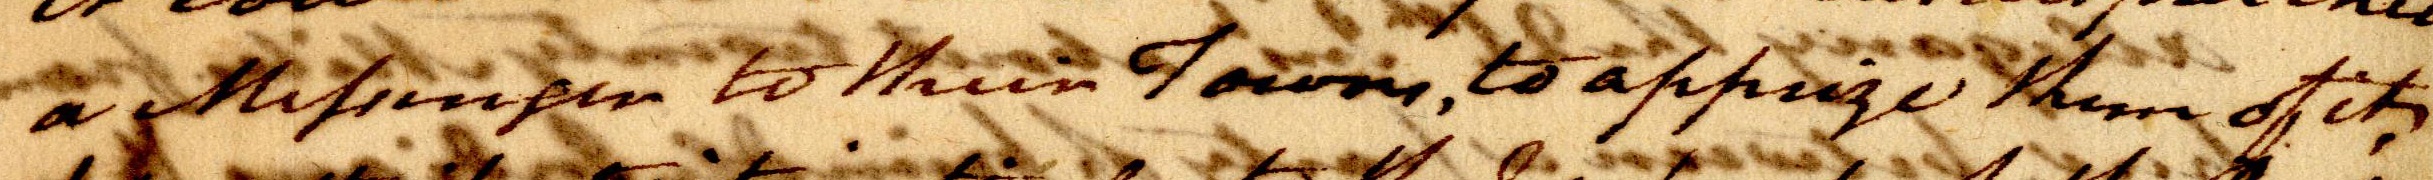a Messenger to their Towns, to apprize them of it,
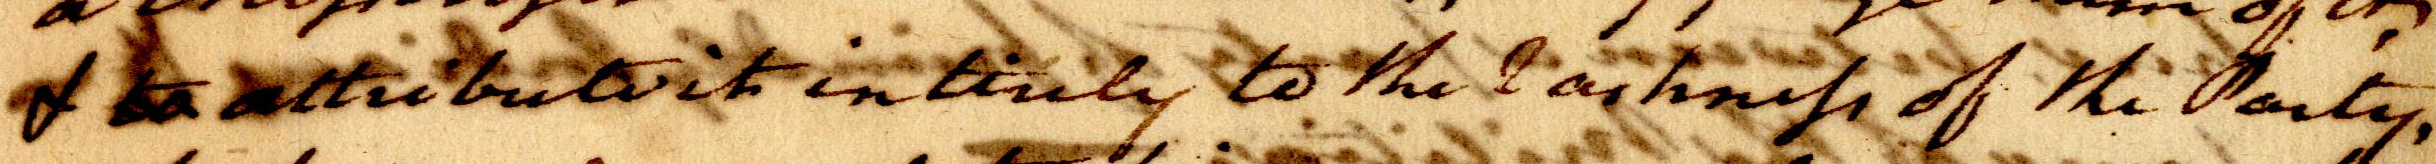& to attribute it intirely to the Rashness of the Party,
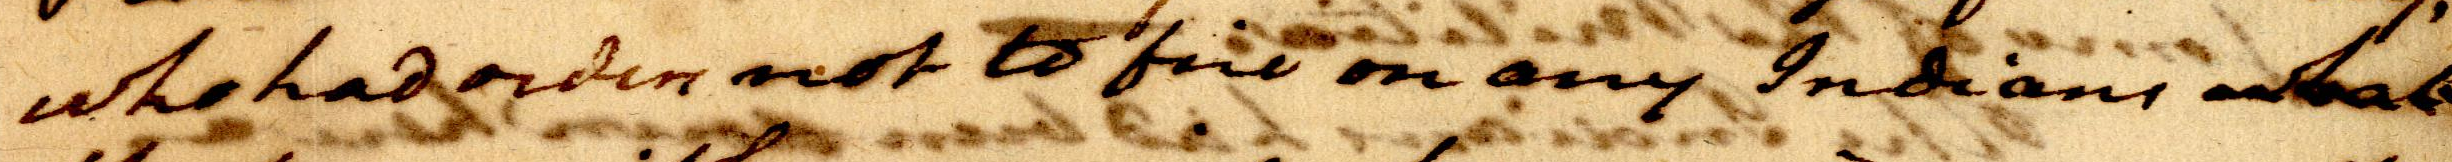who had orders not to fire on any Indians what
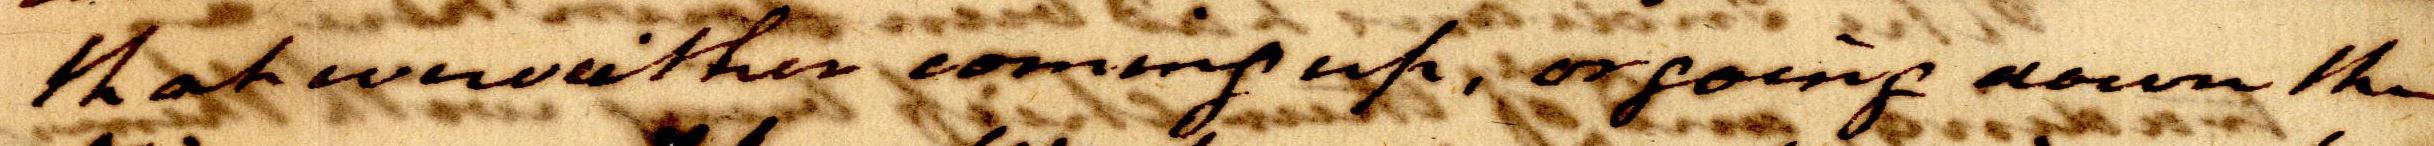that were either coming up, or going down the
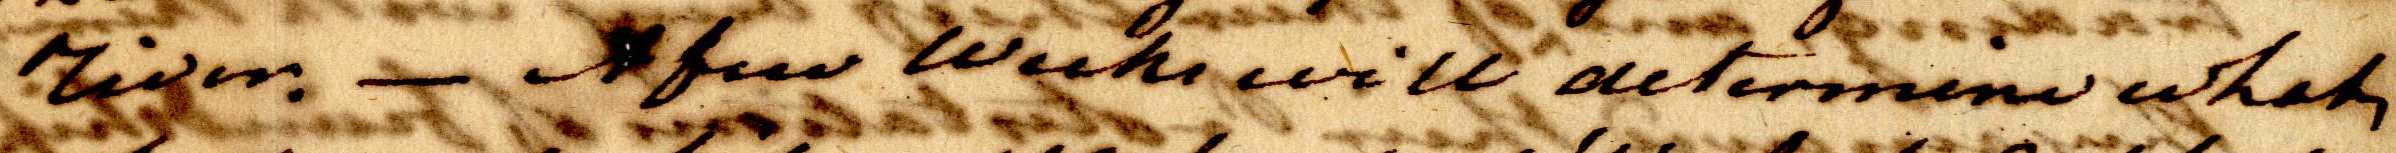river.- A few Weeks will determine what
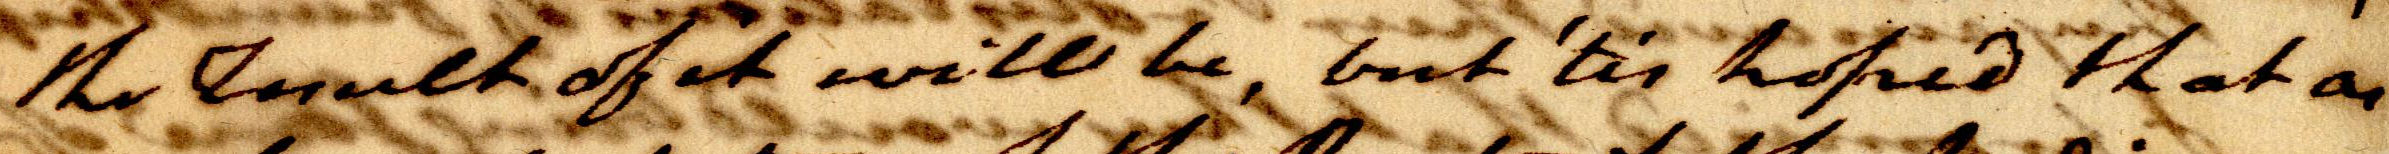the Result of it will be, but 'tis hoped that as
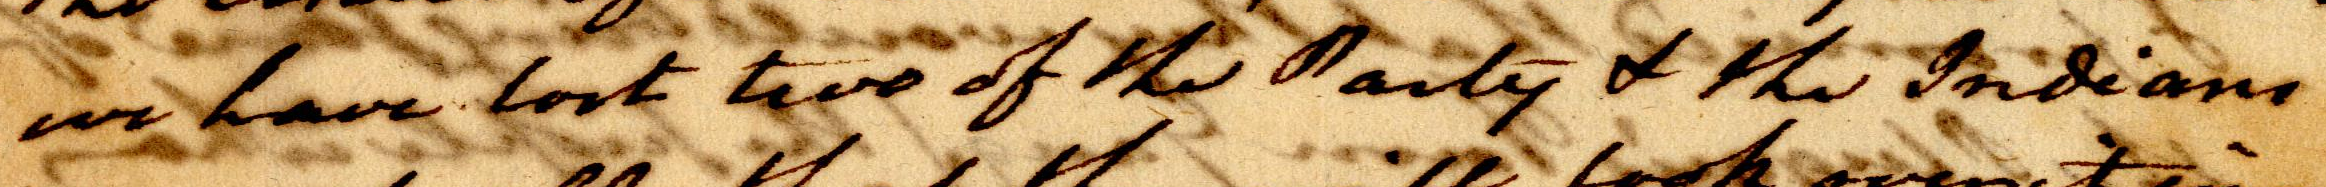we have lost two of the Party & the Indians
